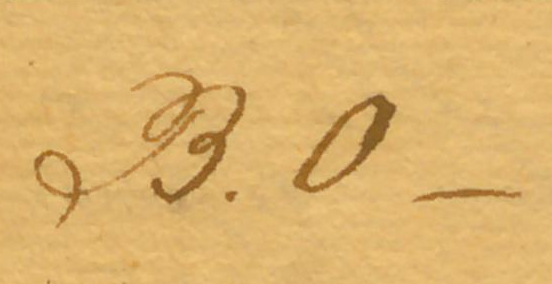B.O-
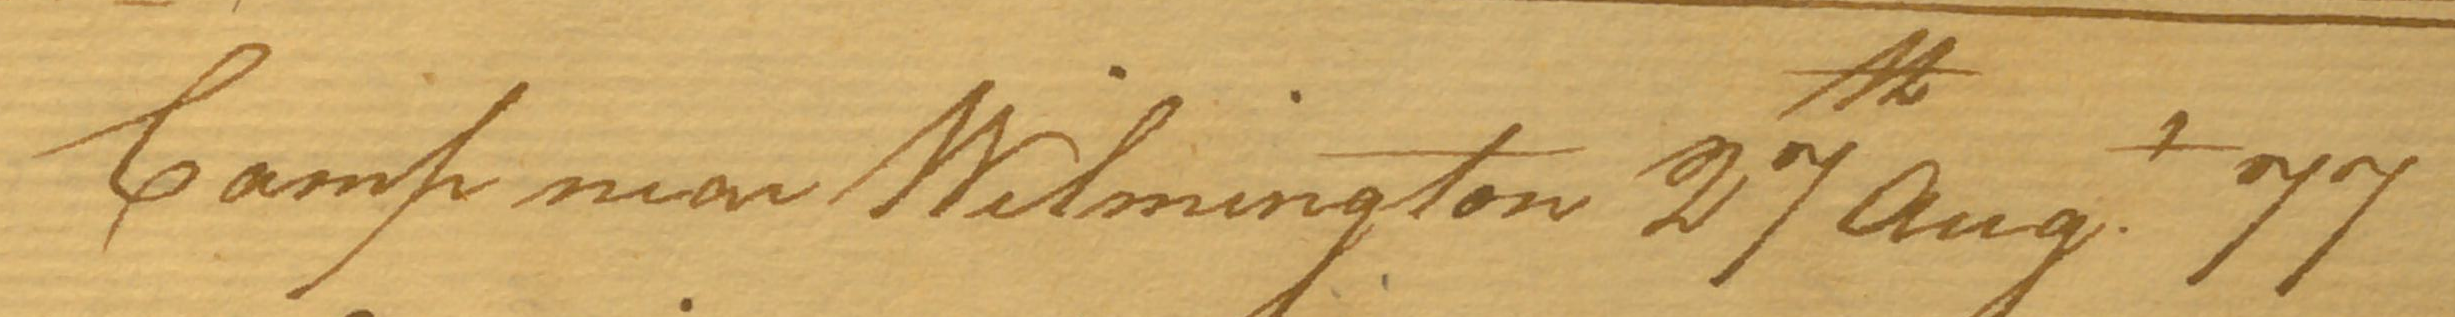Camp near Wilmington 27^th Aug^t. 77
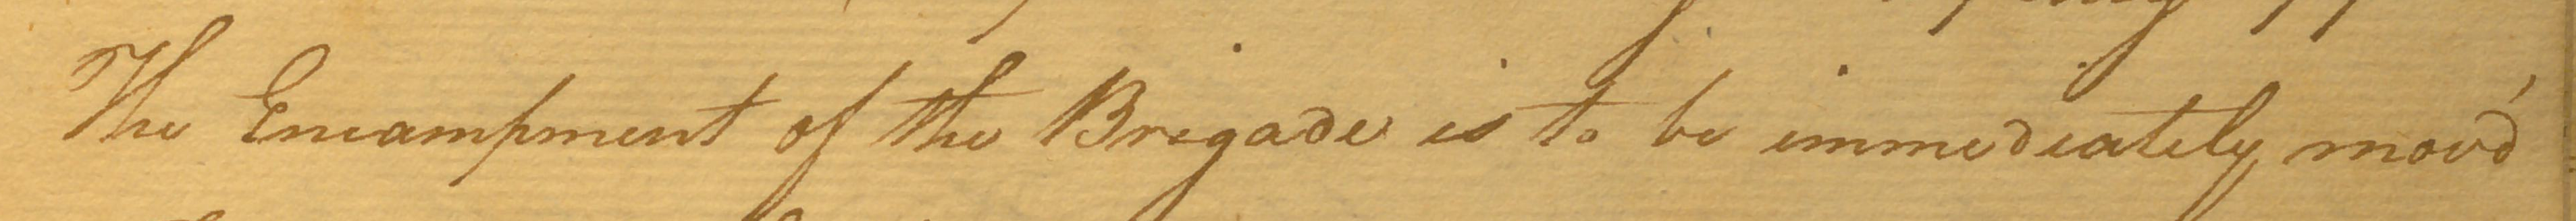The Encampment of the Brigade is to be immediately mov'd
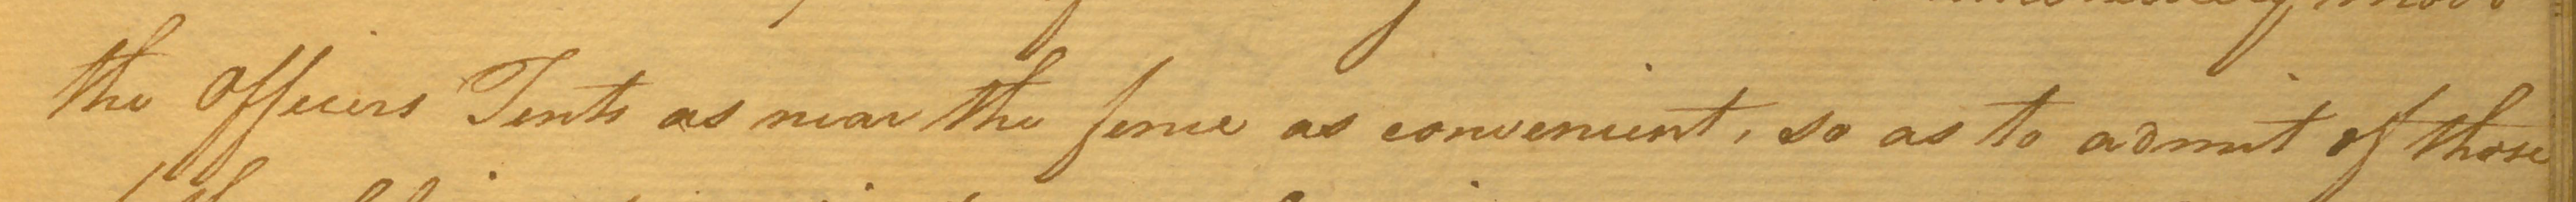the Officers Tents as near the fence as convenient, so as to admit of those
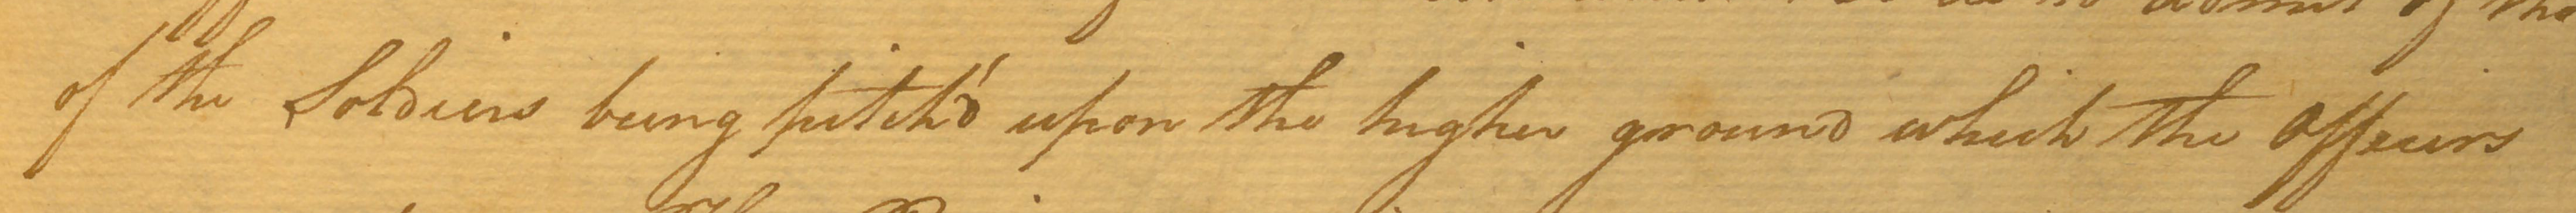of the Soldiers being pitch'd upon the higher ground which the Officers
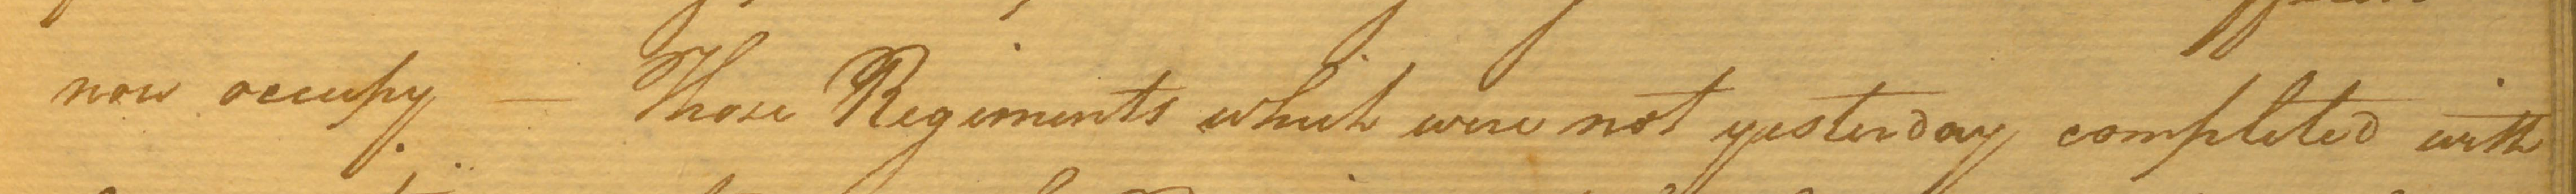now occupy- Those Regiments which were not yesterday completed with
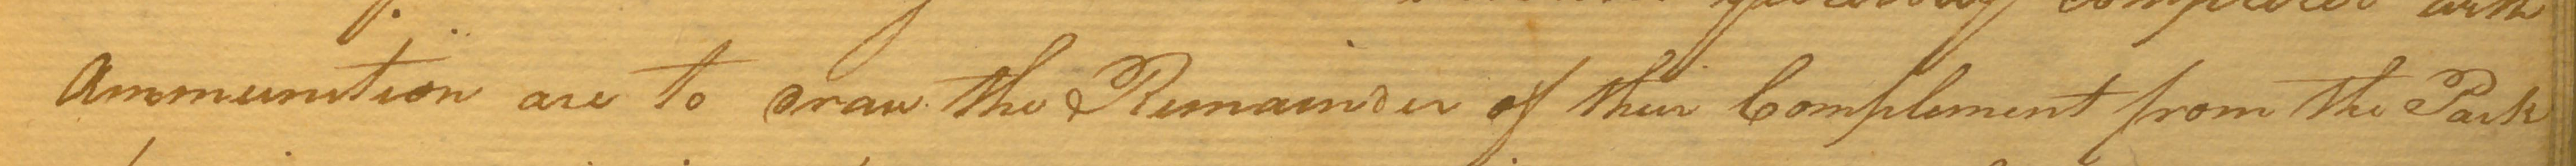Ammunition are to draw the Remainder of their Complement from the Pack
